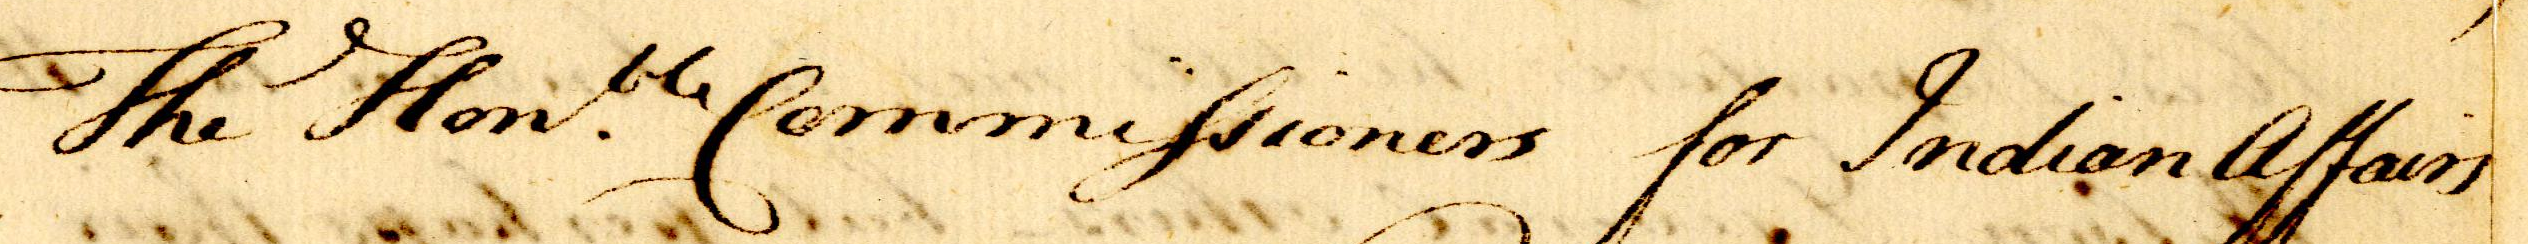The Hon^ble. Commissioners for Indian Affairs
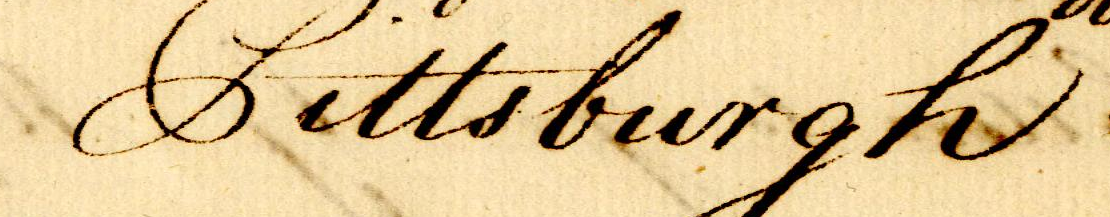Pittsburgh
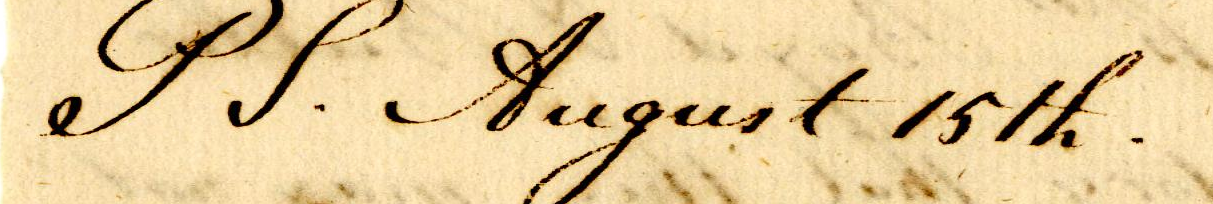PS. August 15th.
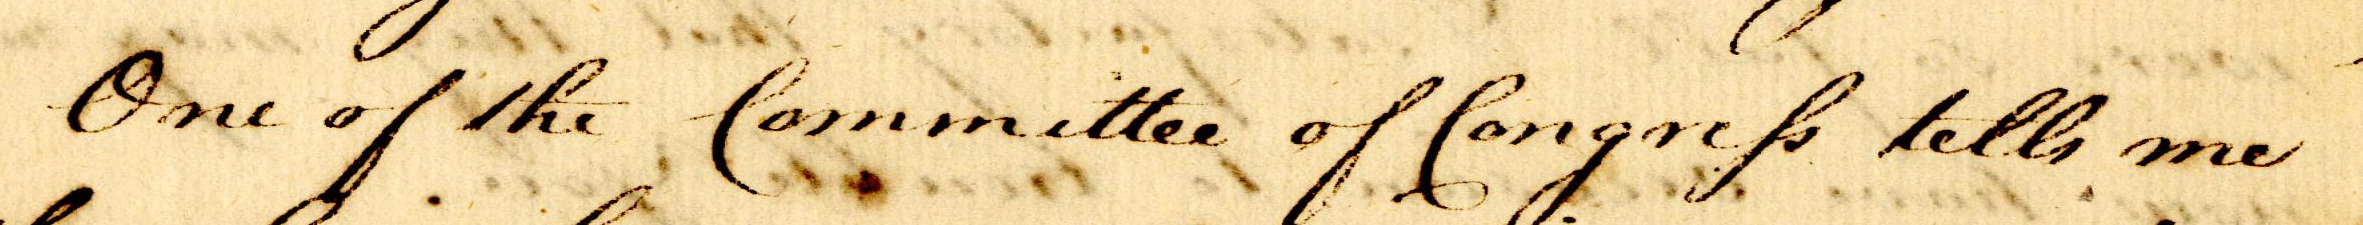One of the Committee of Congress tells me
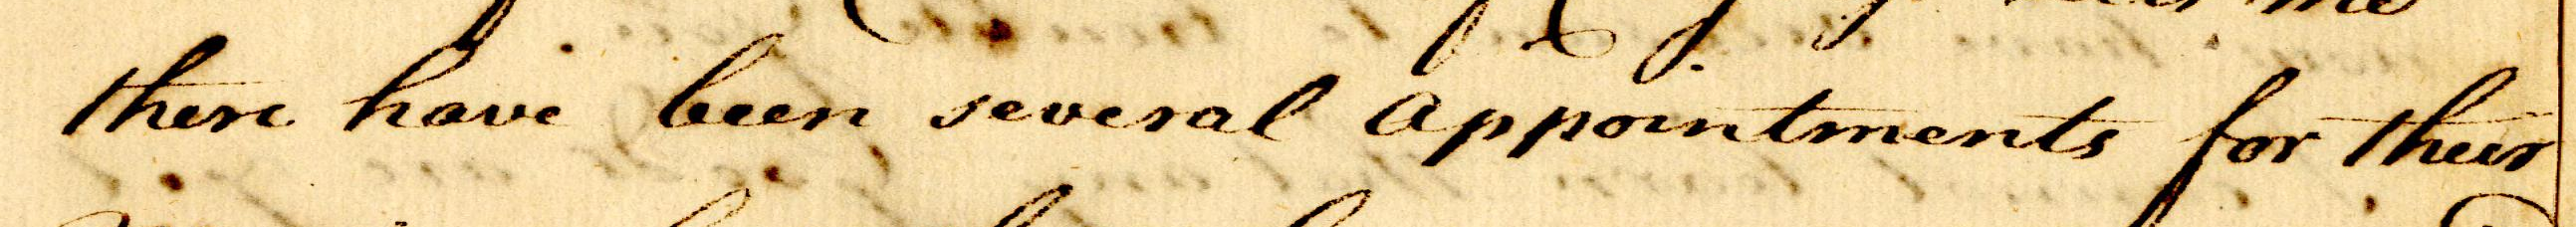there have been several appointments for their
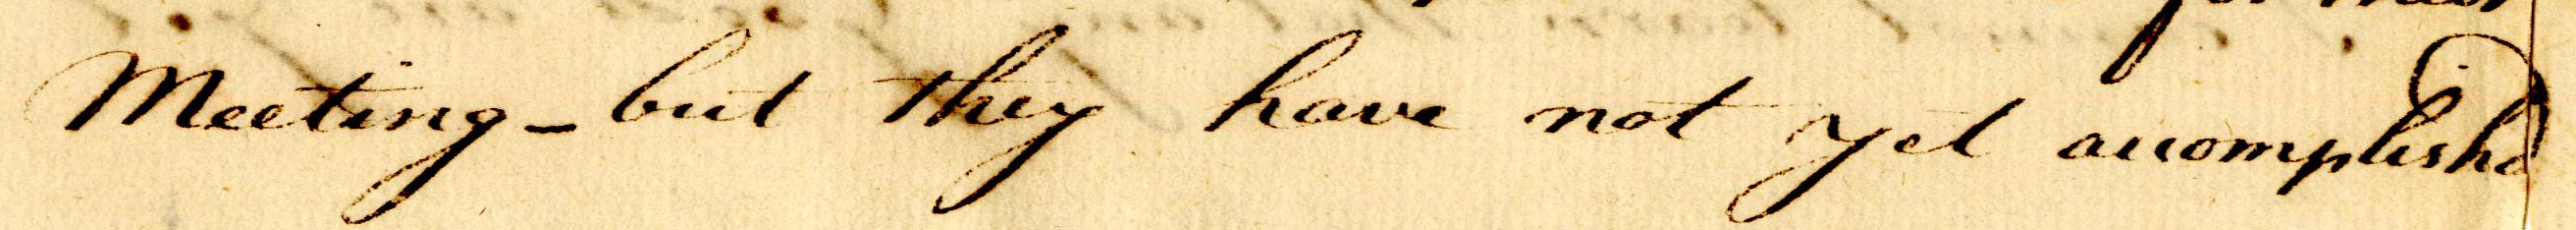Meeting- but they have not yet accomplishd
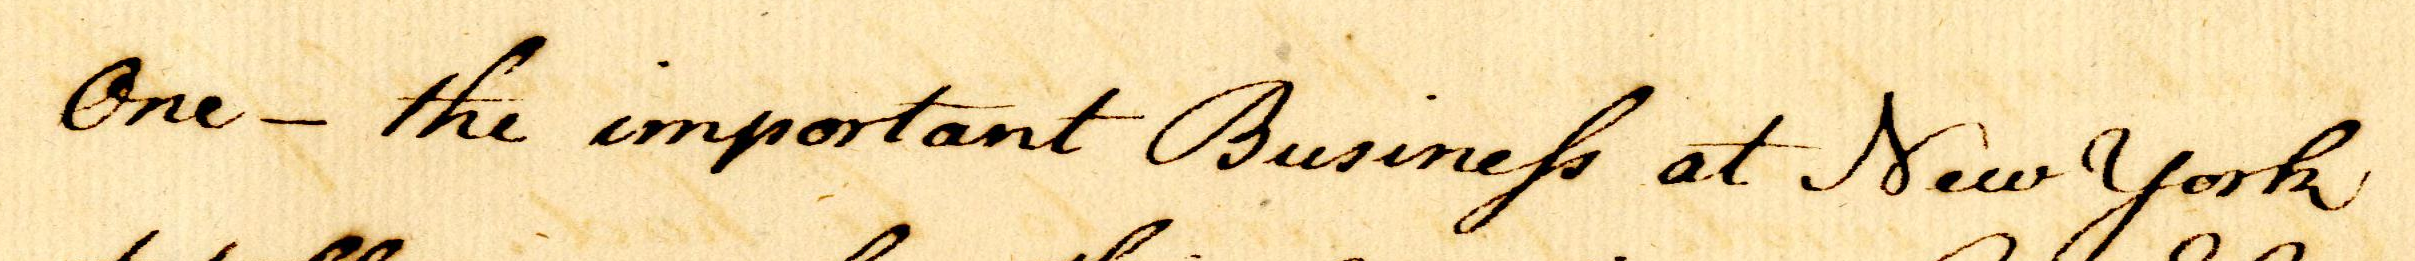One- the important Business at New York
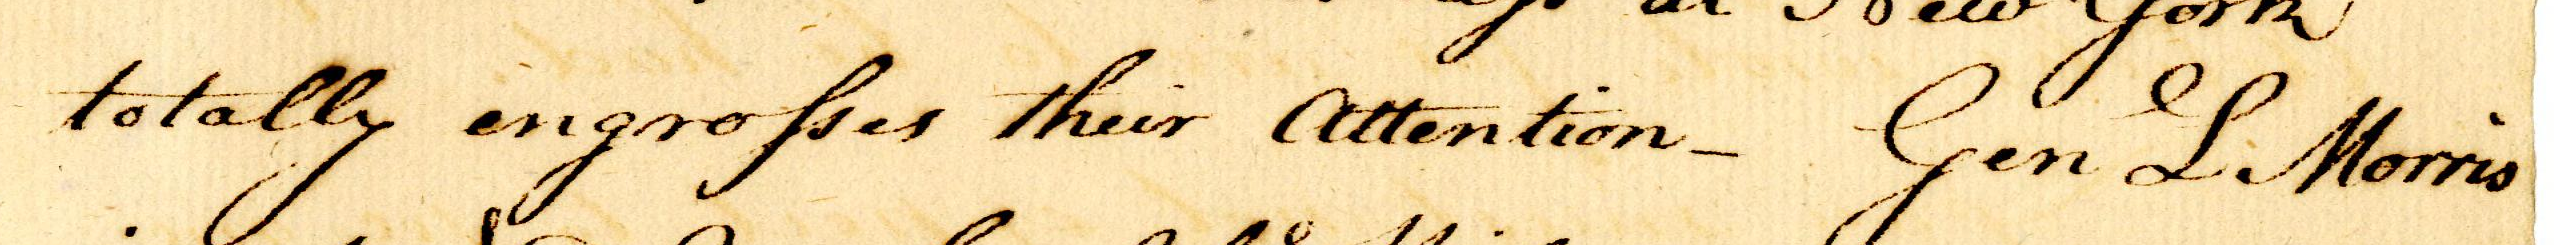totally engrosses their Attention- Gen L Morris
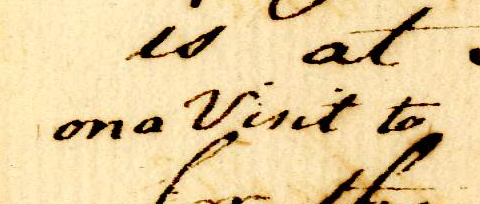on a Visit to
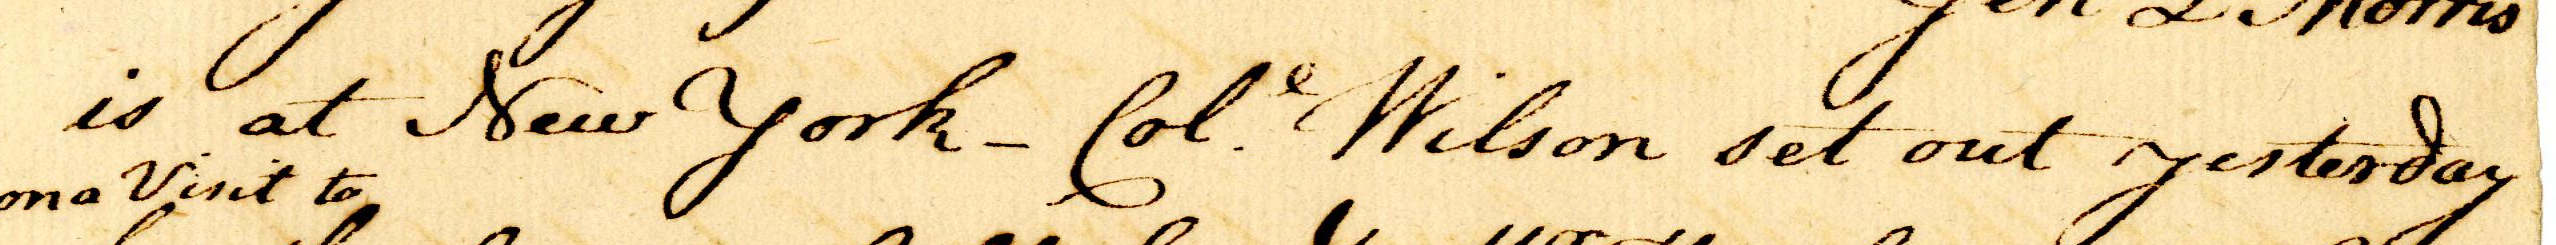is at New York- Col^o. Wilson set out yesterday
